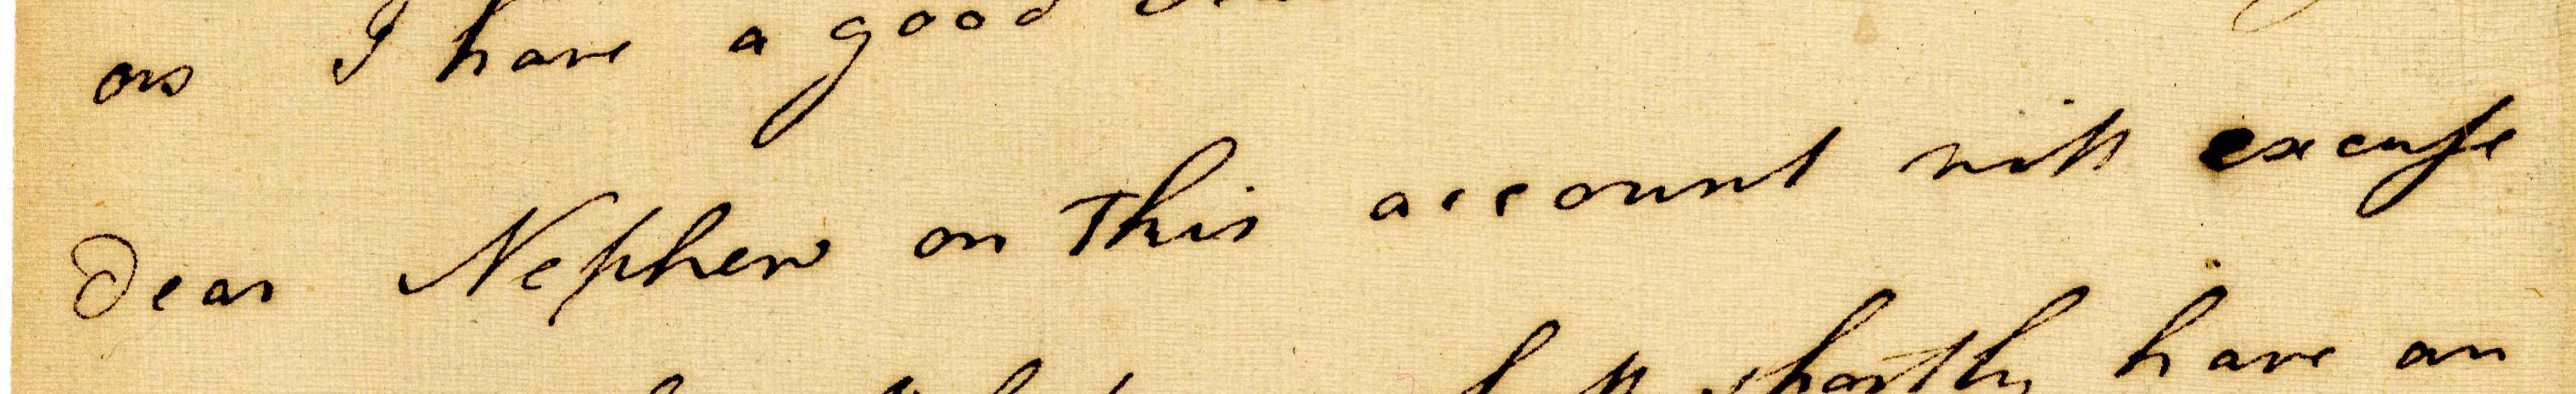dear Nephew on this account with excuse
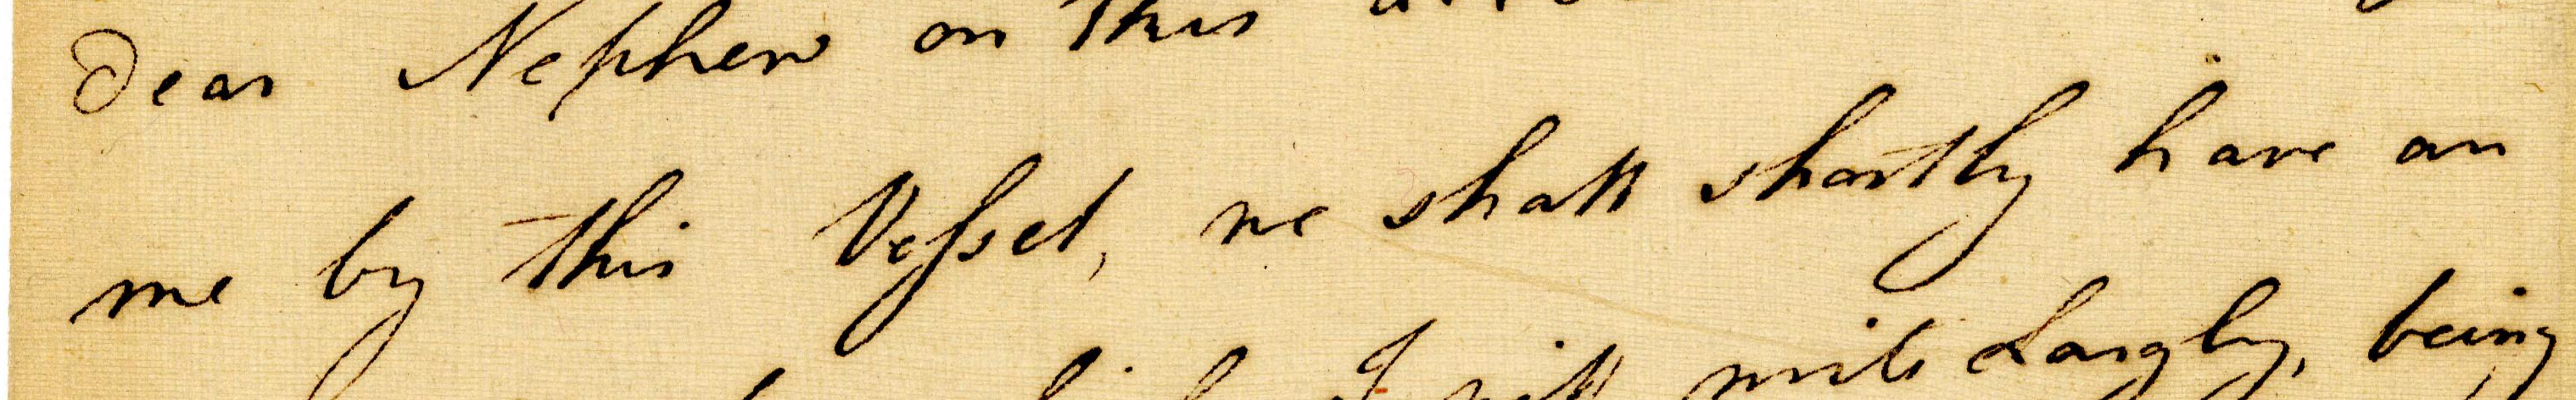me by this Vessel, we shall shortly have an
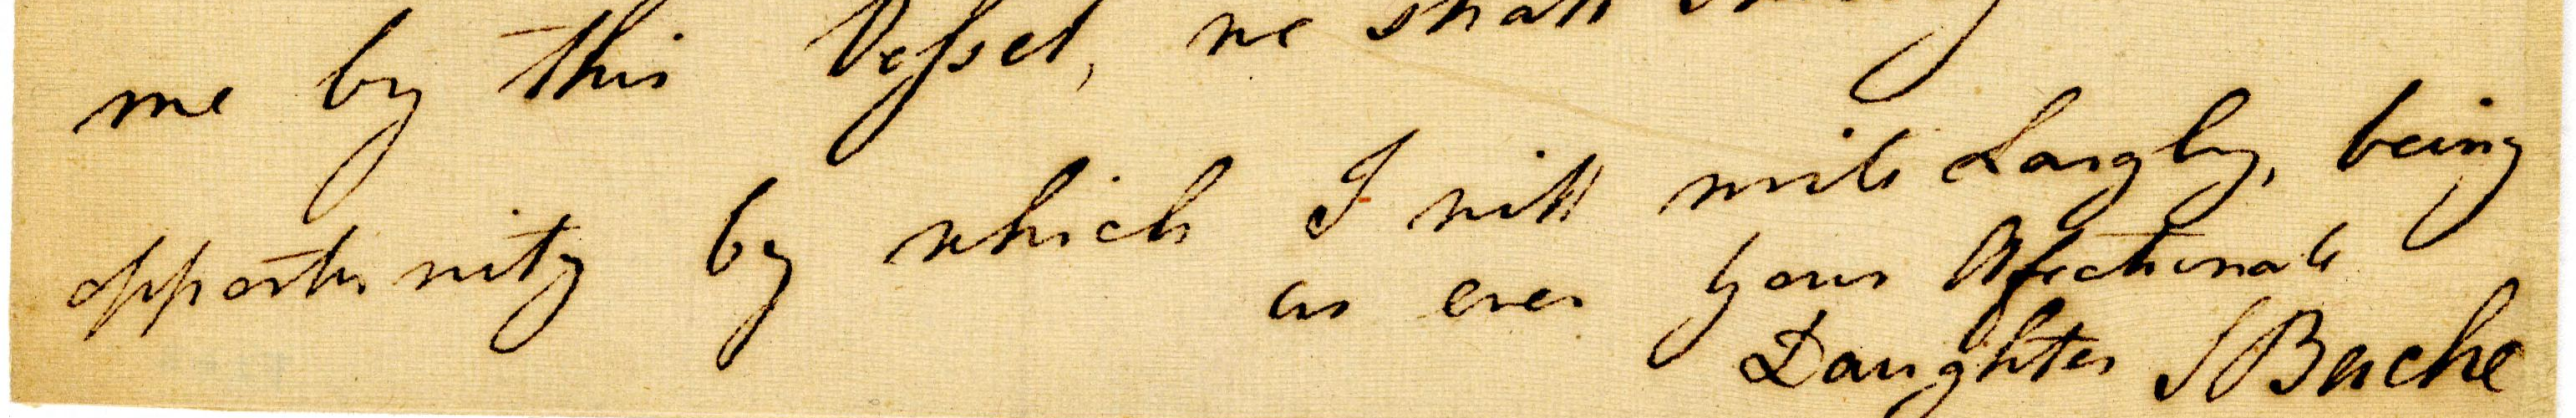opportunity by which I will write Longly, being
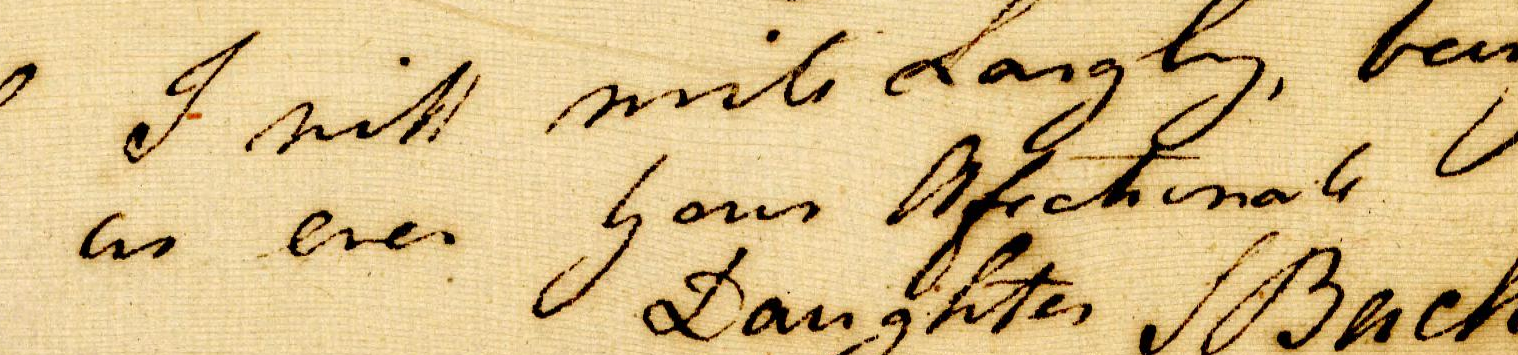as ever your Afectionate
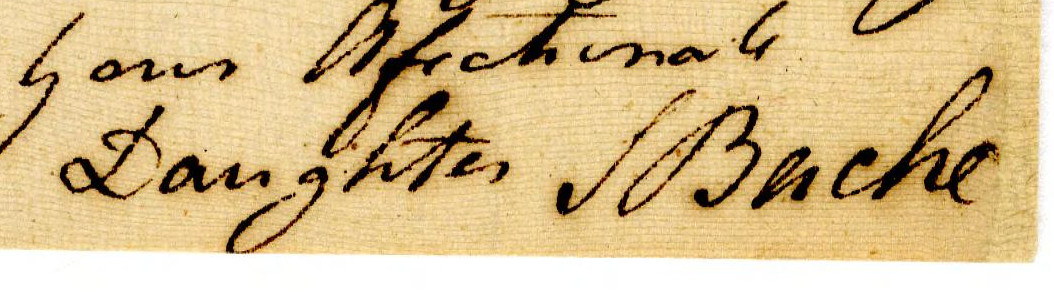Daughter S Bache
